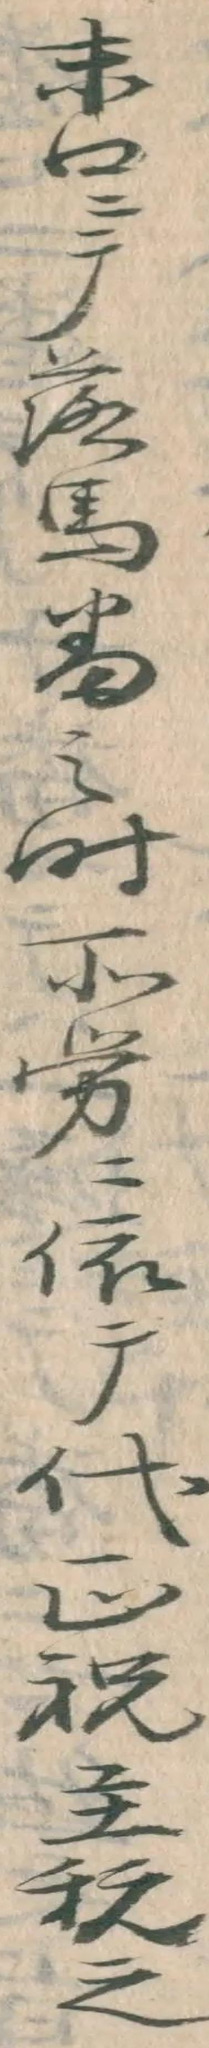末口ニテ落馬番之時所労ニ依テ代正祝主税之
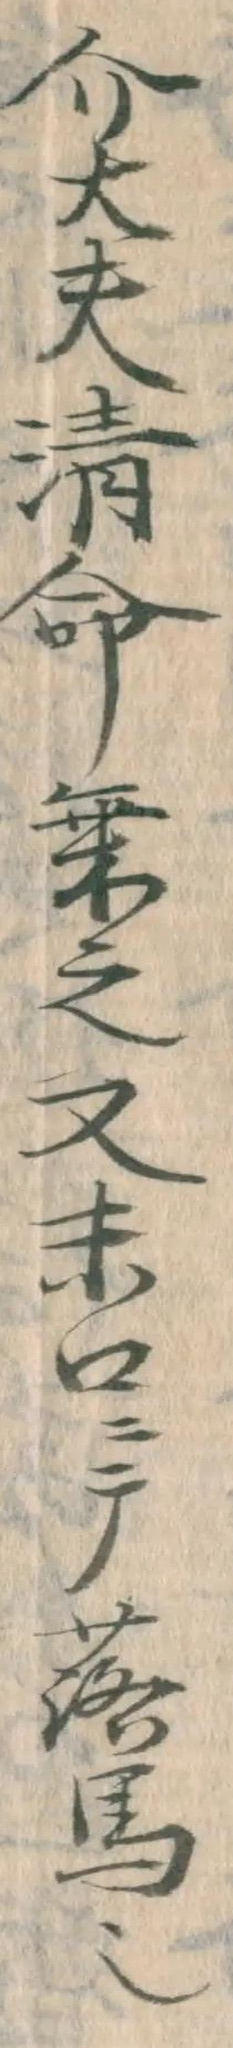介大夫清命乗之又末口ニテ落馬也
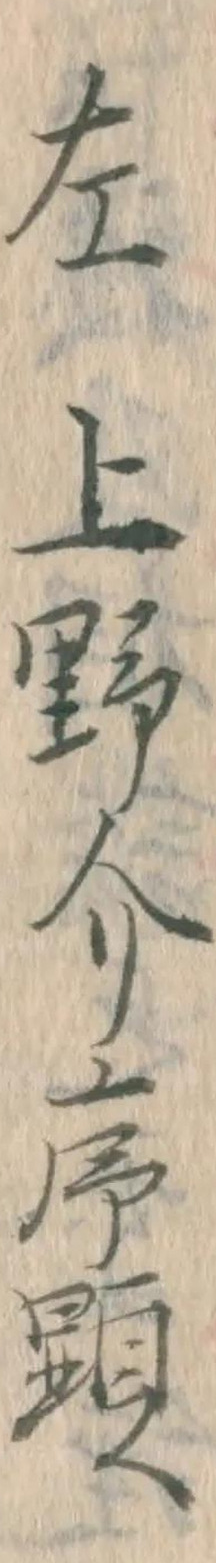左上野介序顕
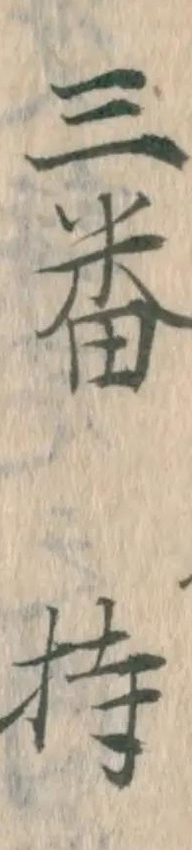三番持
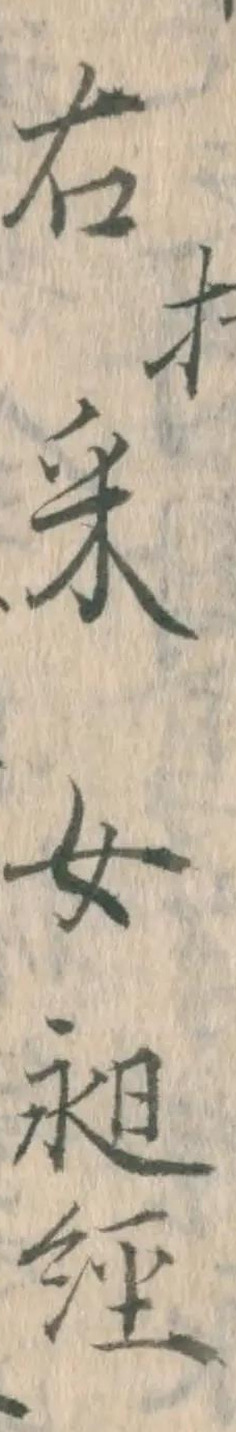右采女昶経
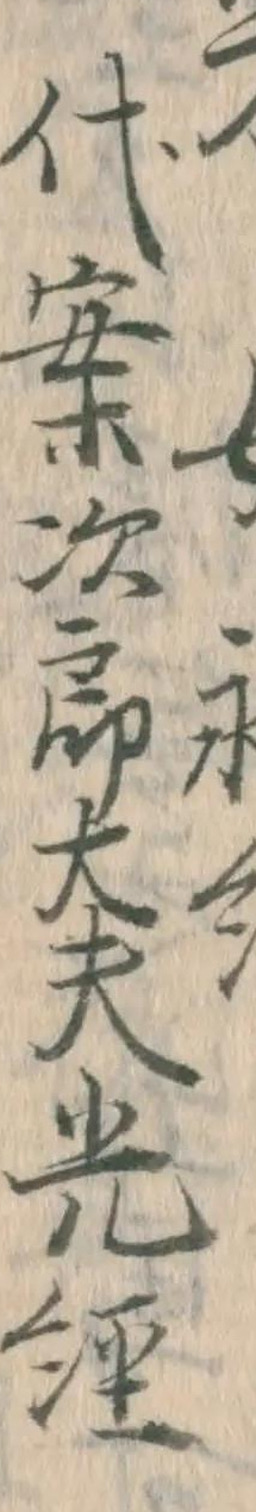代案次郎大夫光経
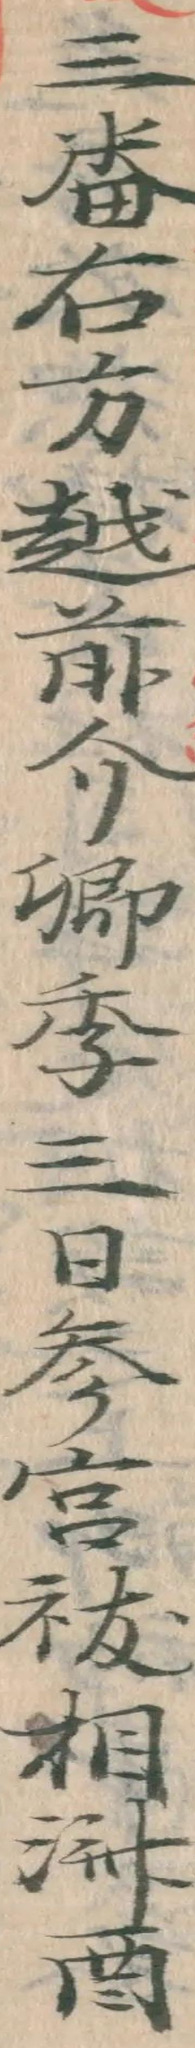三番右方越前介卿季三日参宮祓相済酉
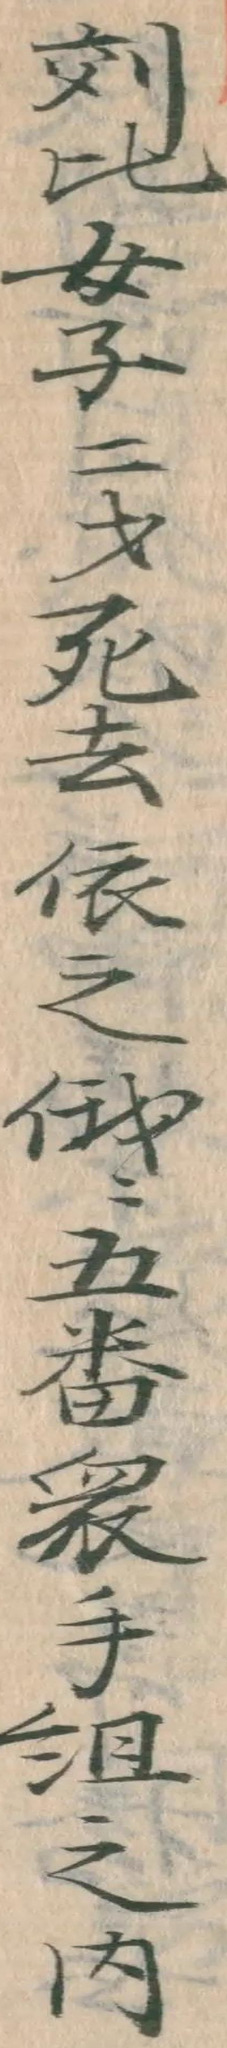刻比女子二才死去依之俄ニ五番衆手組之内
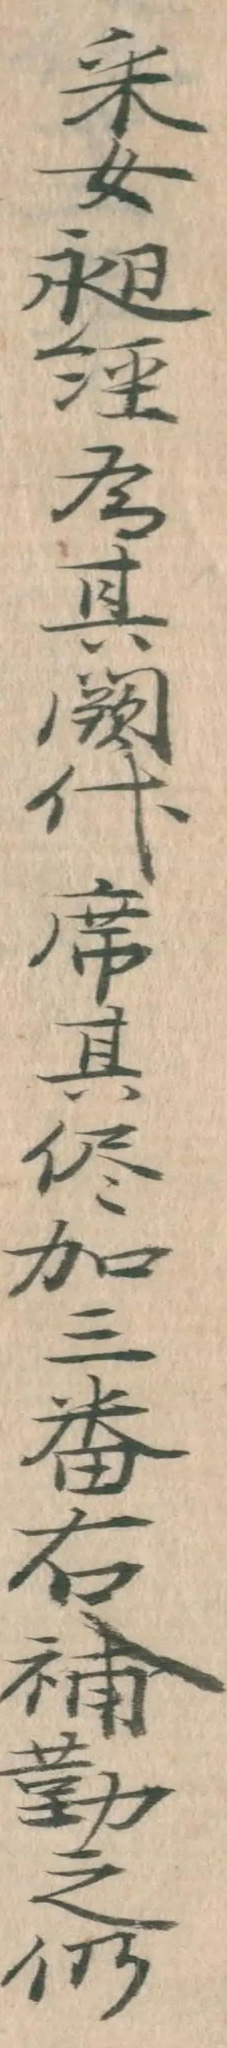采女昶経為其闕代席其侭加三番右補勤之仍
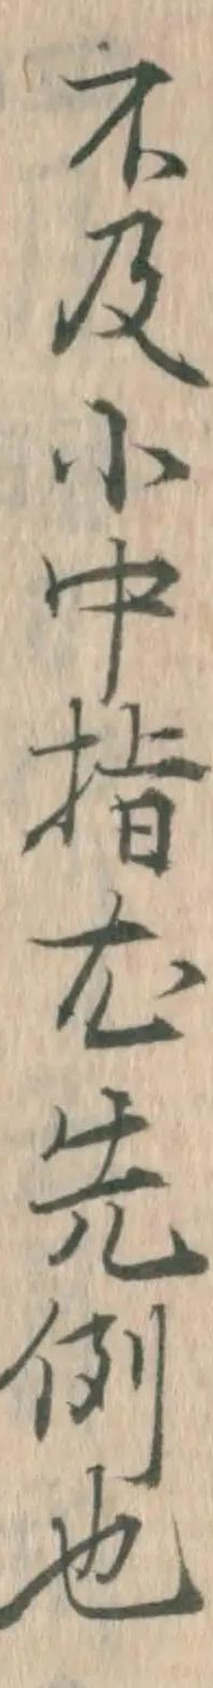不及小中指尤先例也

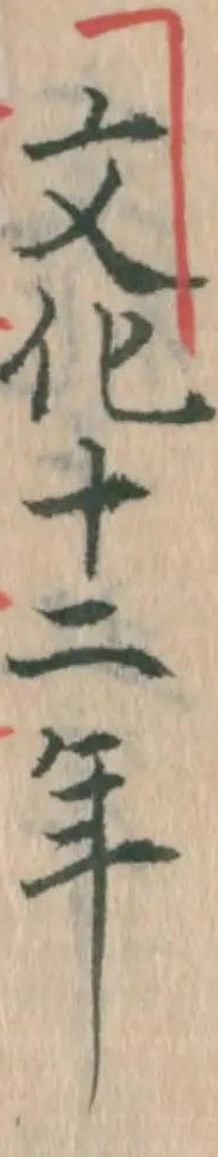文化十二年
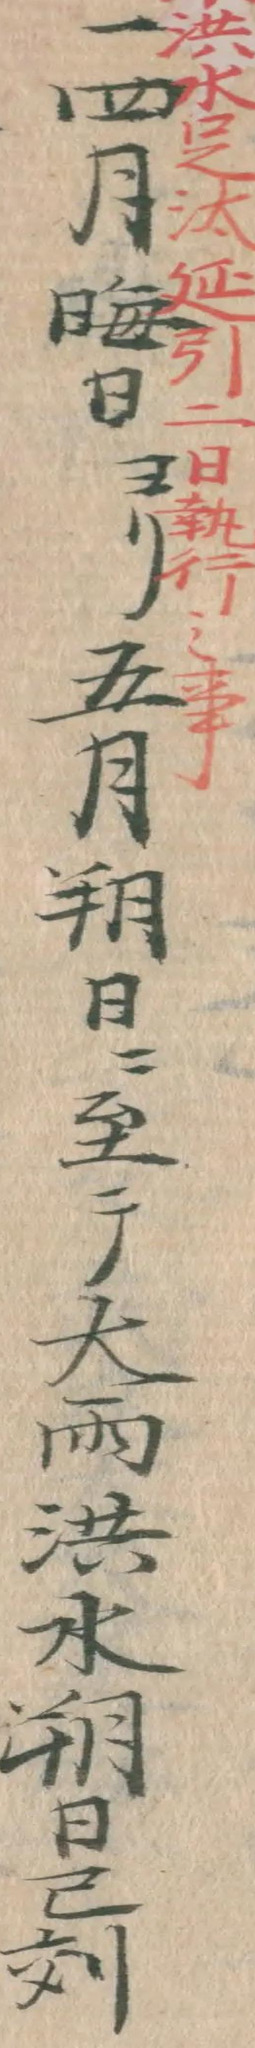一四月晦日ヨリ五月朔日ニ至テ大雨洪水朔日己刻
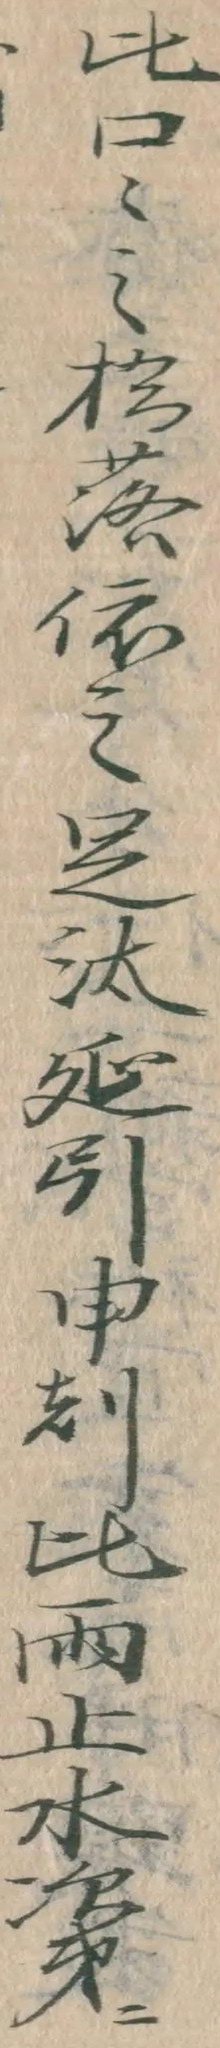比口々之橋落依之足汰延引申刻比雨止水次第ニ
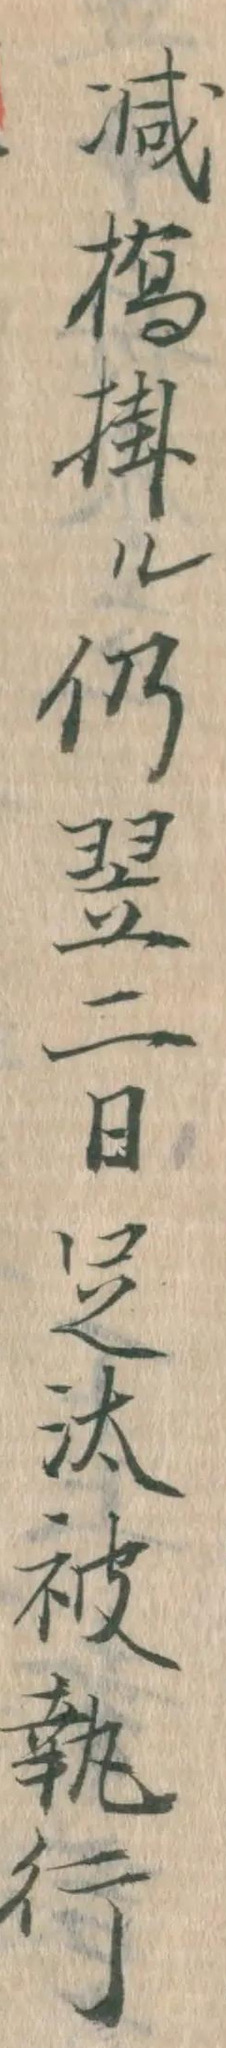減橋掛ル仍翌二日足汰被執行
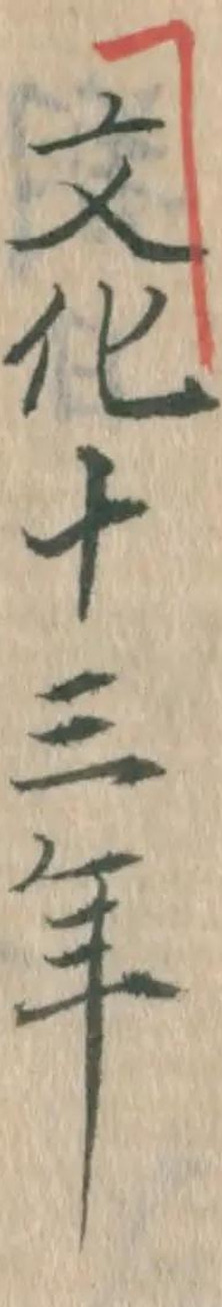文化十三年
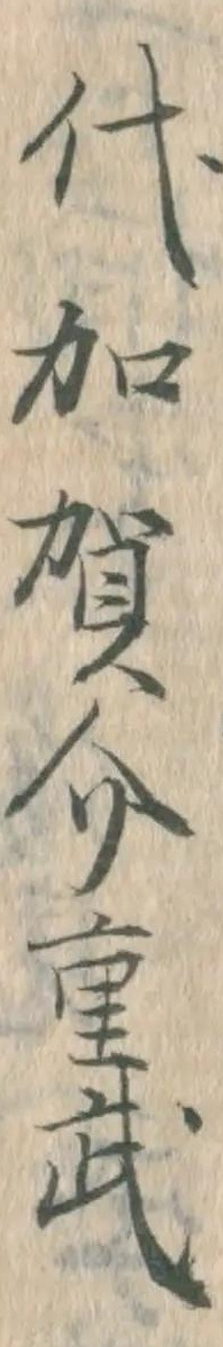代加賀介重武
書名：賀茂社記録. 第10冊
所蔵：国立国会図書館 National Diet Library, JAPAN
